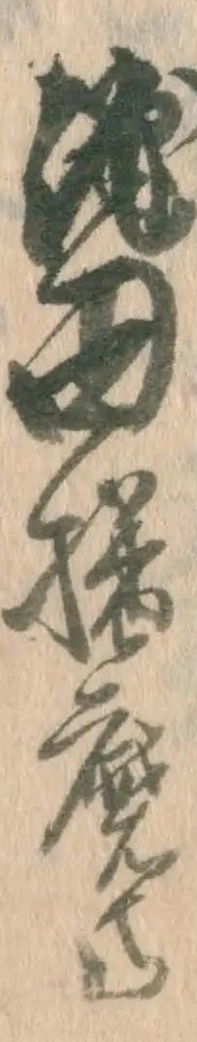池田播磨守
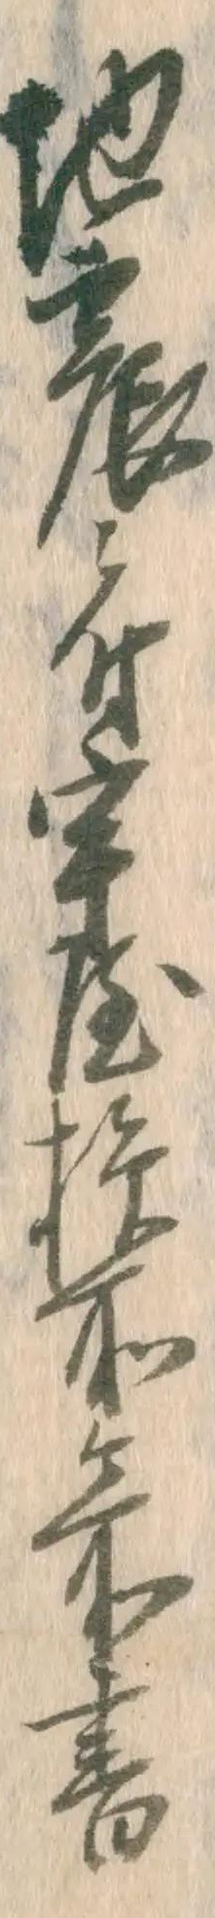│地震ニ付牢屋損所ケ所書
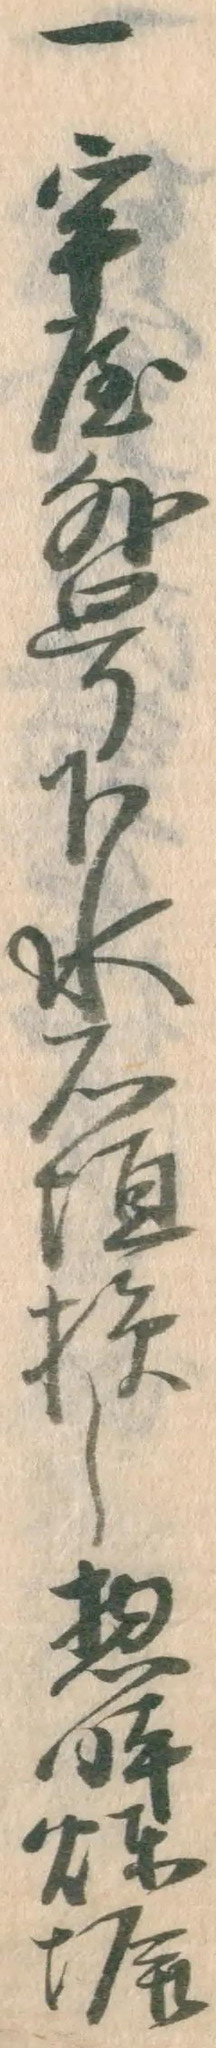一牢屋外廻り下水石垣損し惣体煉塀
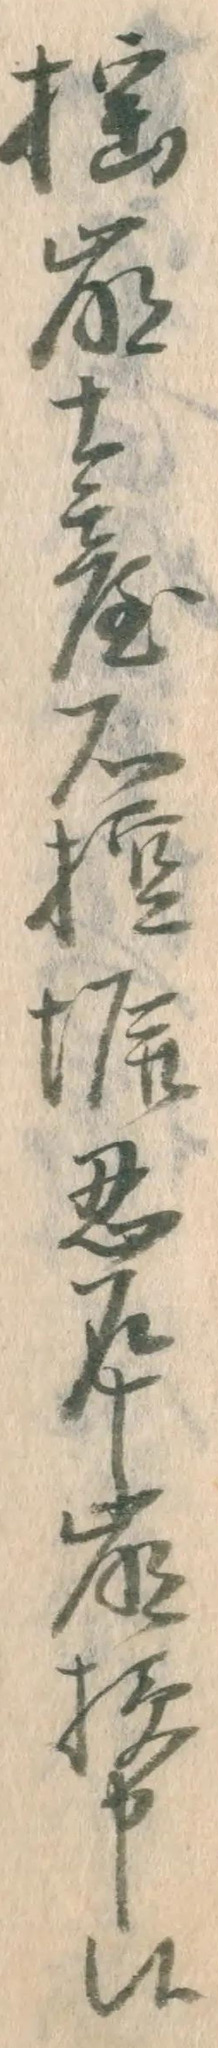揺崩土台石控塀忍び返し崩損申候

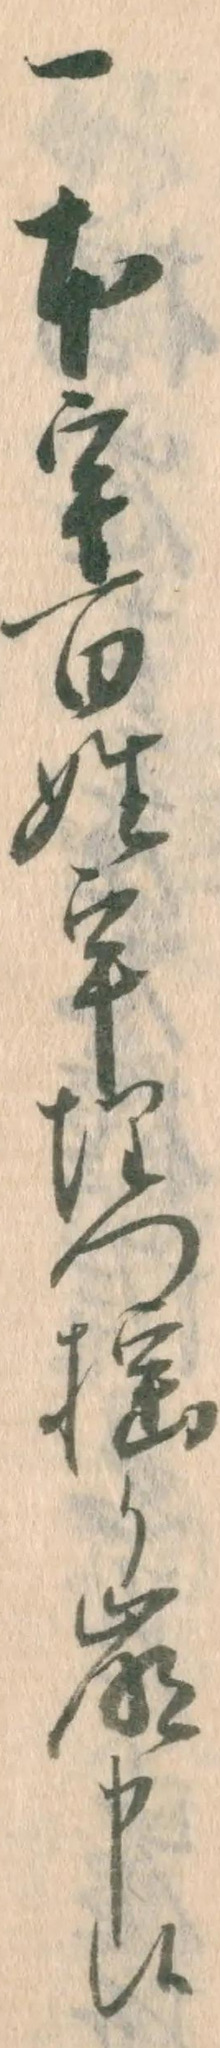一本牢百姓牢埋門揺り崩申候
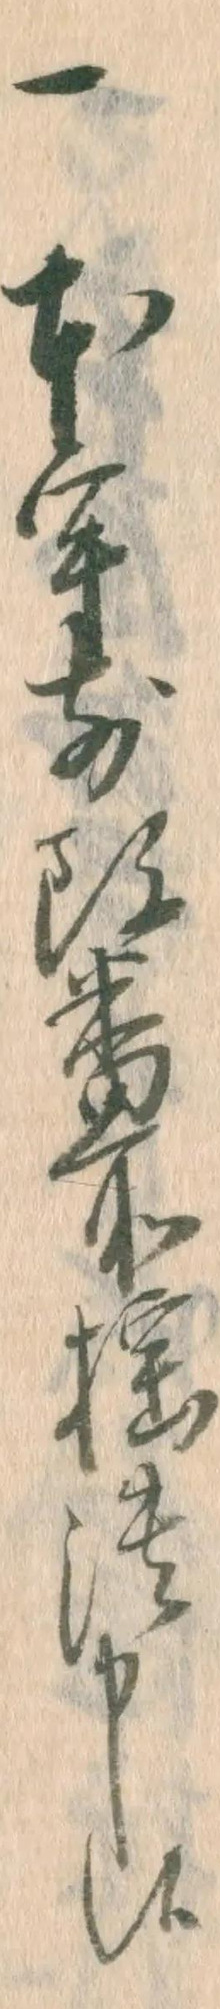一本牢前改番所揺潰申候
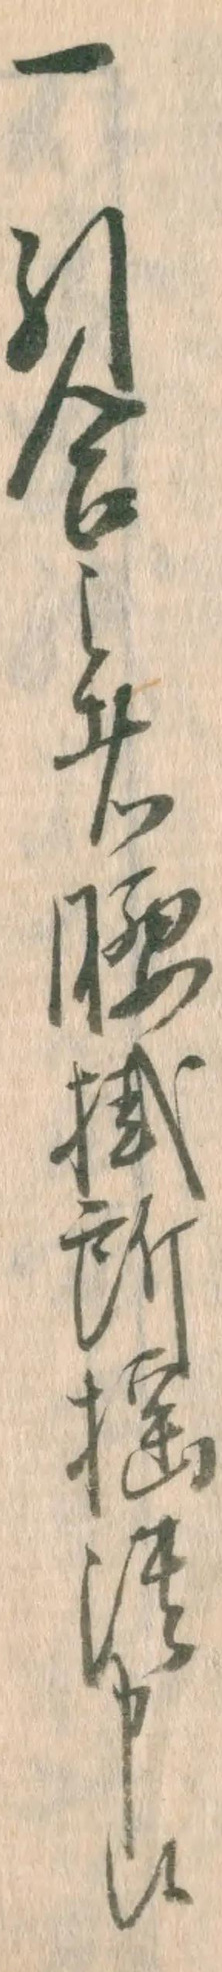一引合之者腰掛所揺潰申候
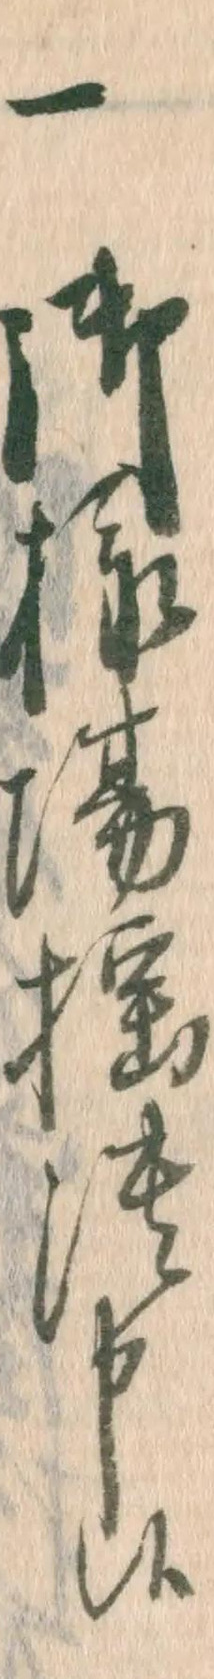一御様場揺潰申候
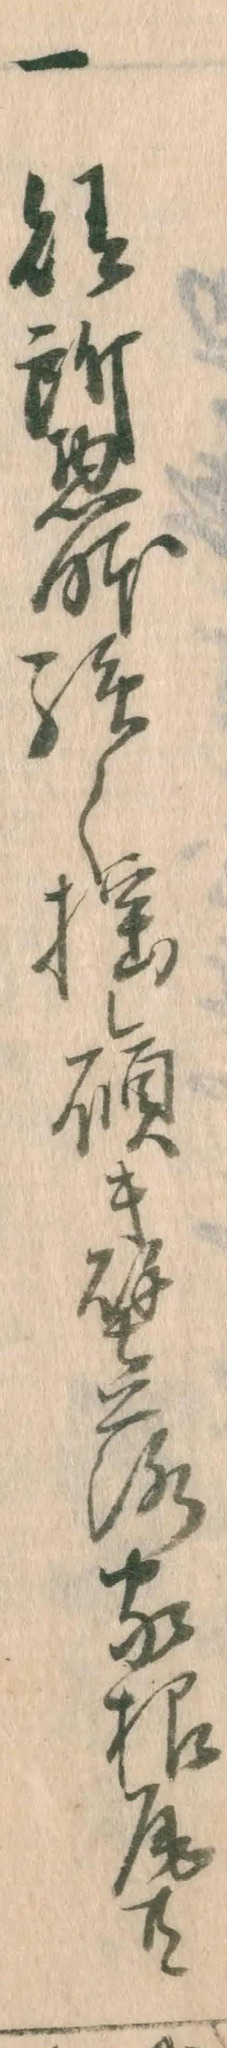一賄所惣体強く揺レ傾キ壁崩家根瓦共┏下
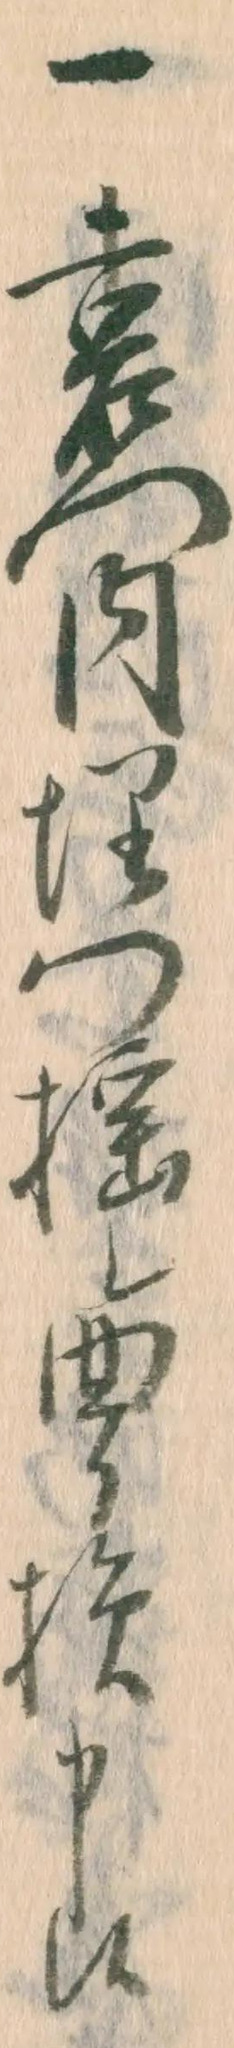一裏門内埋門揺レ曲り損申候
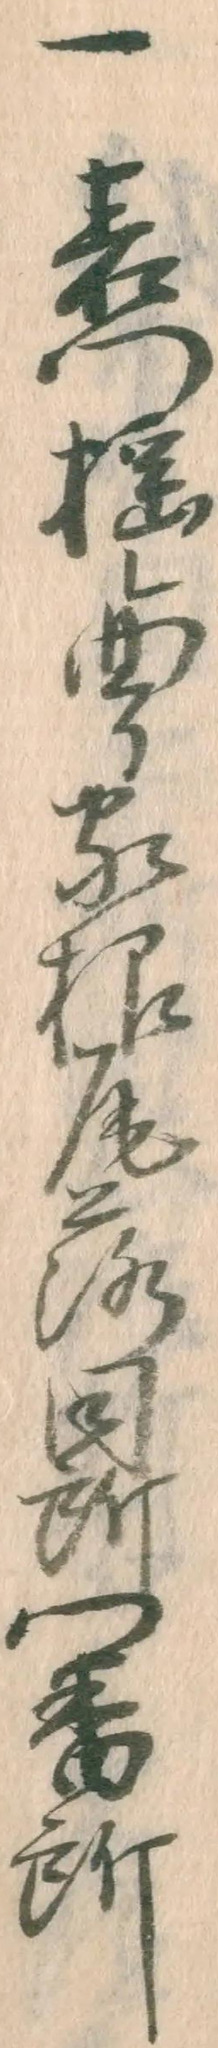一表門揺レ曲り家根瓦落同断御番所
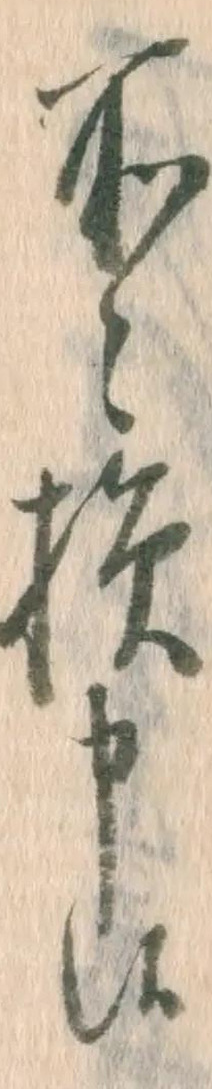所〻損申候
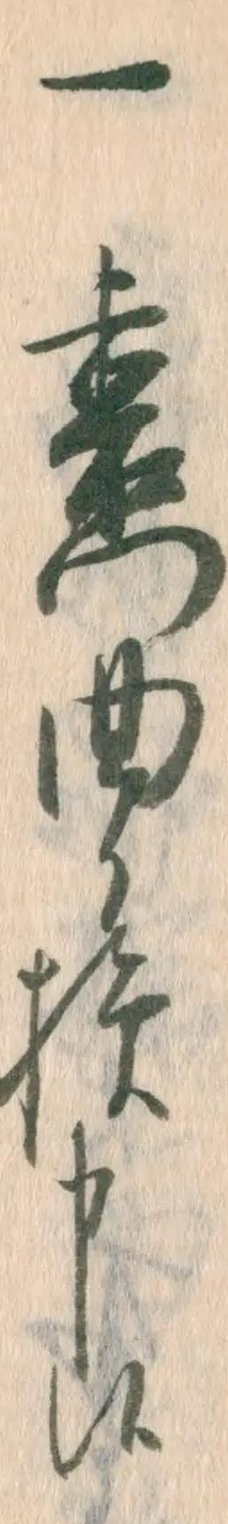一裏門曲り損申候
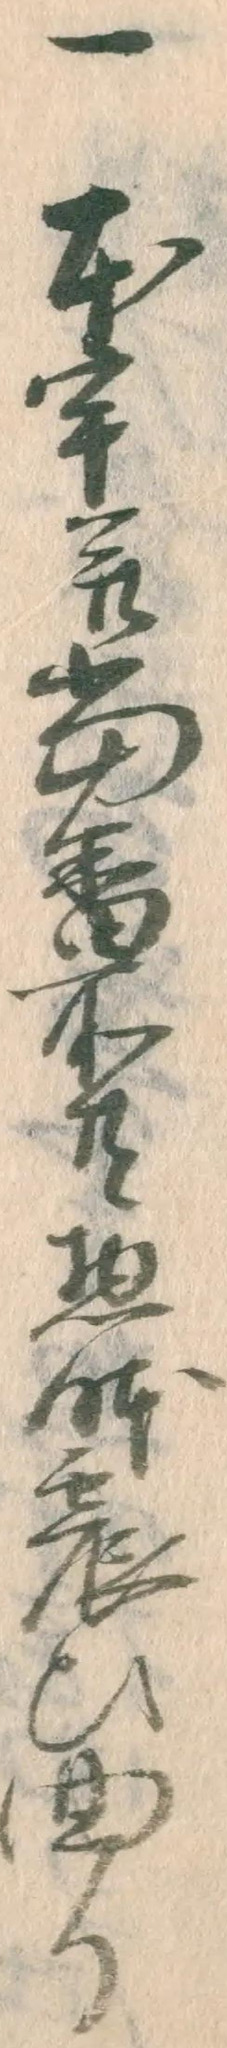一本牢屋当番所共惣体震ひ曲り
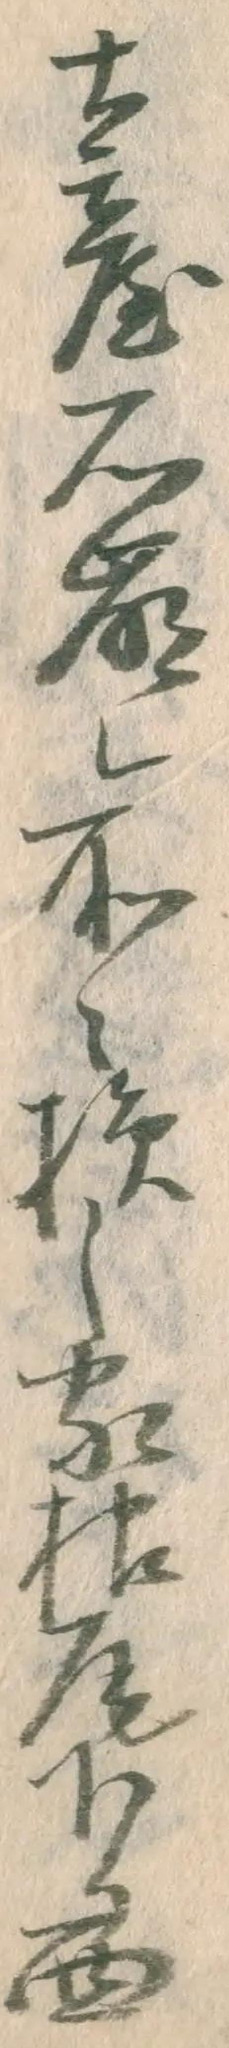土台石崩レ所〻損し家根瓦下り西

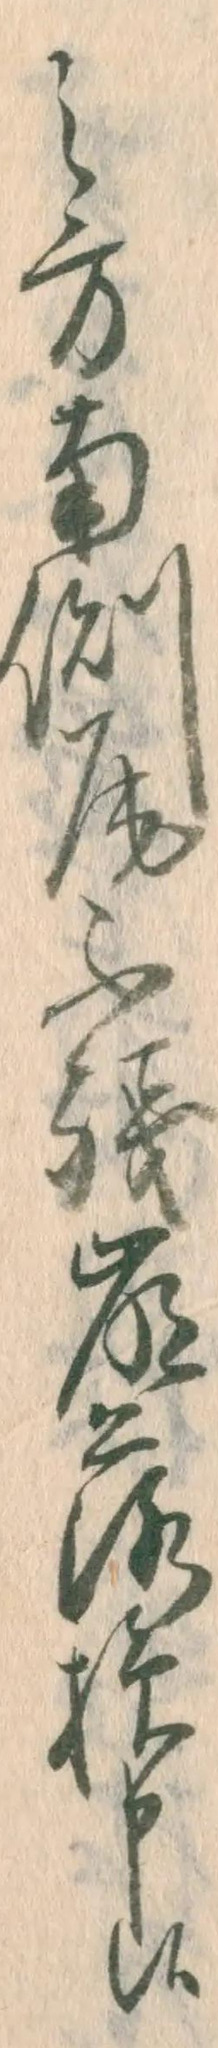之方南側不残崩落損申候
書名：七十冊物類集 71巻. [44] 四十三 牢屋敷御普請御修覆地震ニ付骨折候牢屋掛御褒美之部
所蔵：国立国会図書館 National Diet Library, JAPAN
